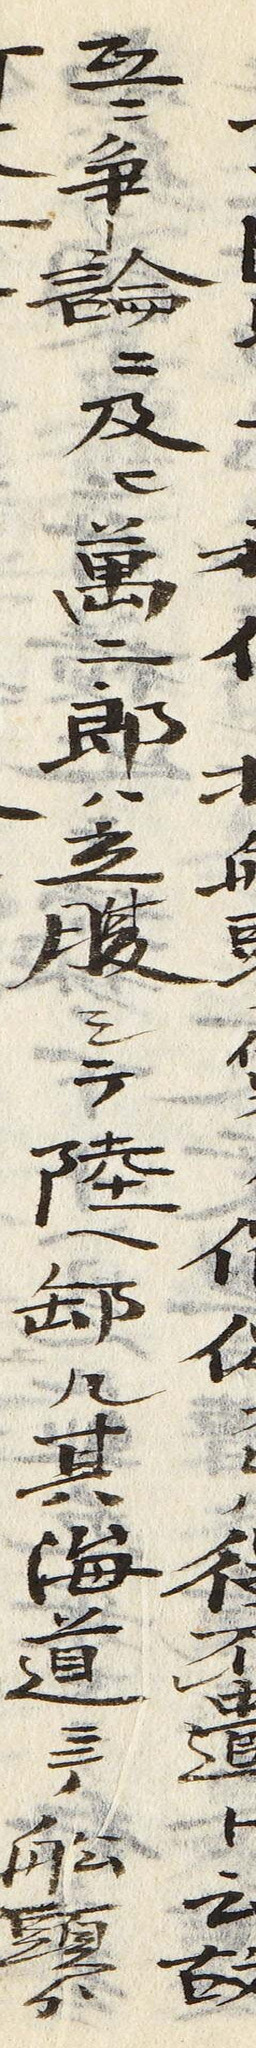互ニ争論ニ及ヒ萬二郎ハ立腹シテ陸ヘ卸ル其海道ニテ船頭ゟ
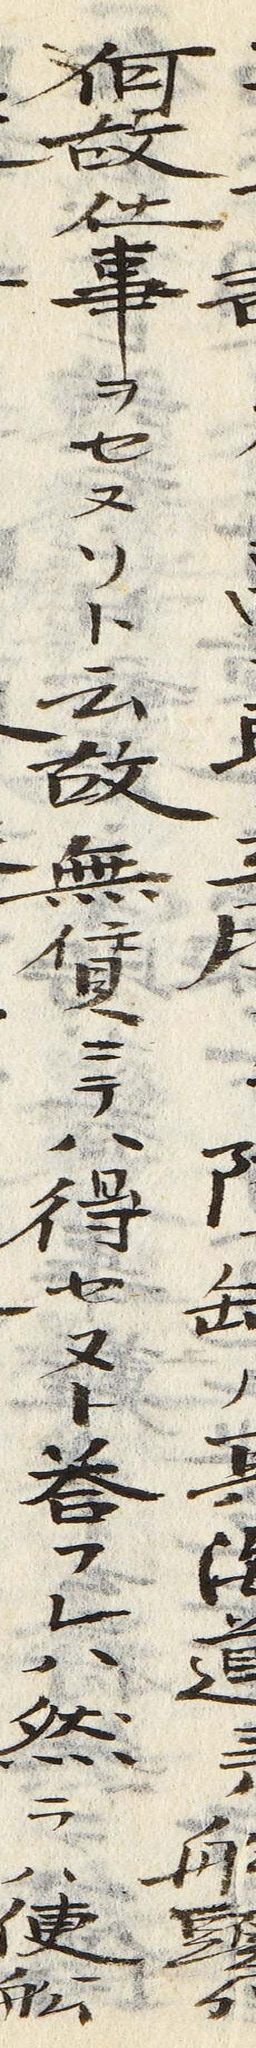何故仕事ヲセヌソト云故無賃ニテハ得セヌト答フレハ然ラハ便船
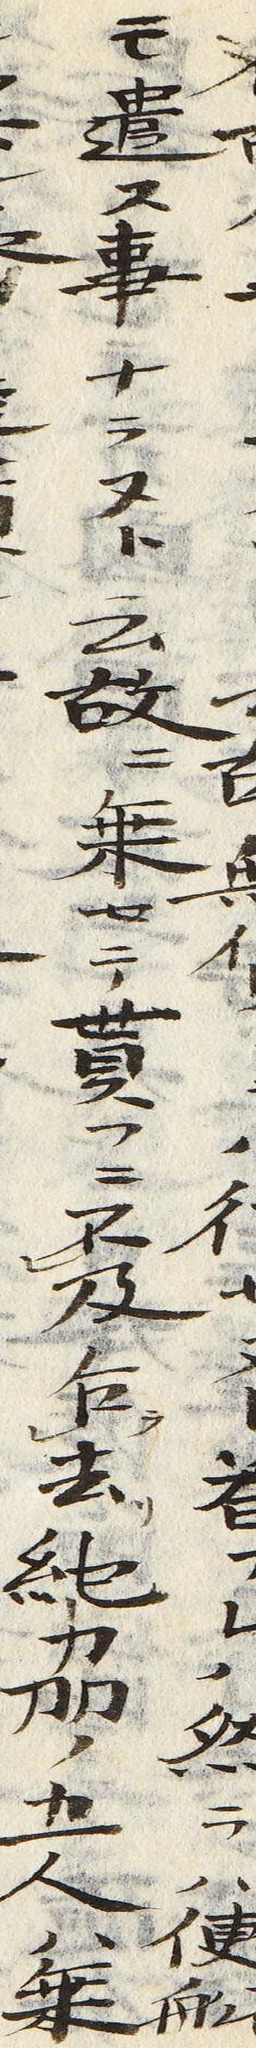モ遣ス事ナラヌト云故ニ乗セテ貰フニ不及乍去紀州ノ五人ハ乗
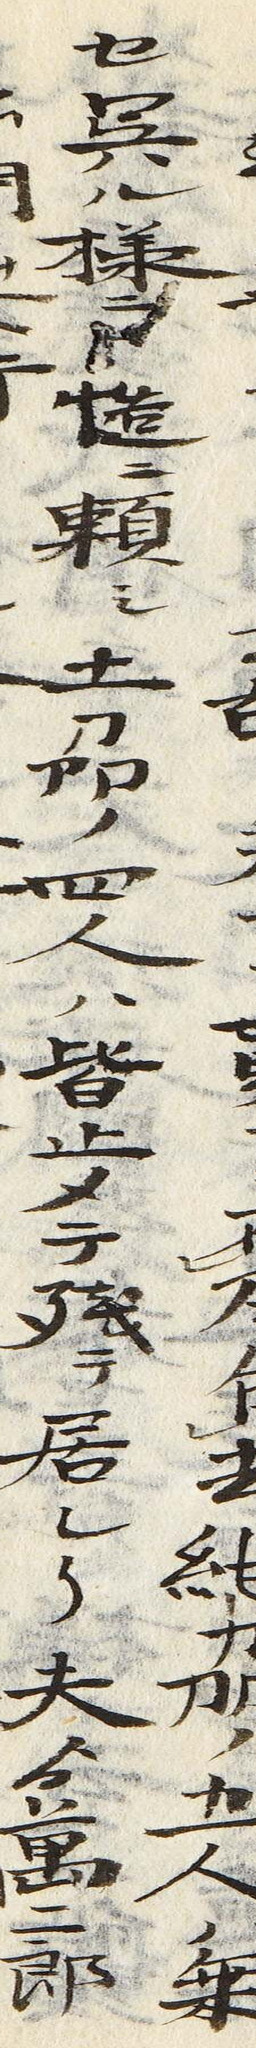セ呉ル様ニ慥ニ頼シ土州ノ四人ハ皆止メテ残テ居レリ夫ゟ萬二郎
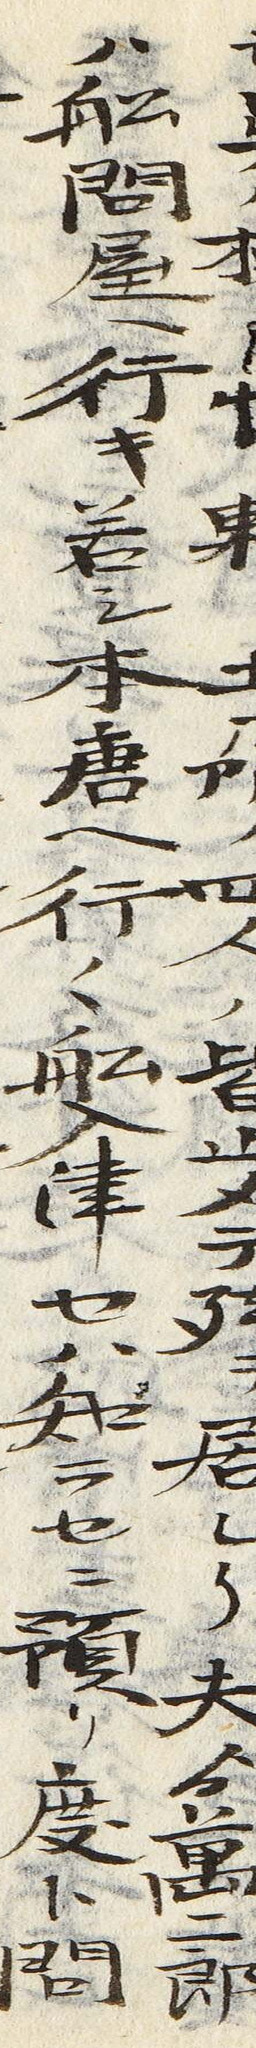ハ船問屋ヘ行キ若シ本唐ヘ行く船入津セハ知ラセニ預リ度ト問
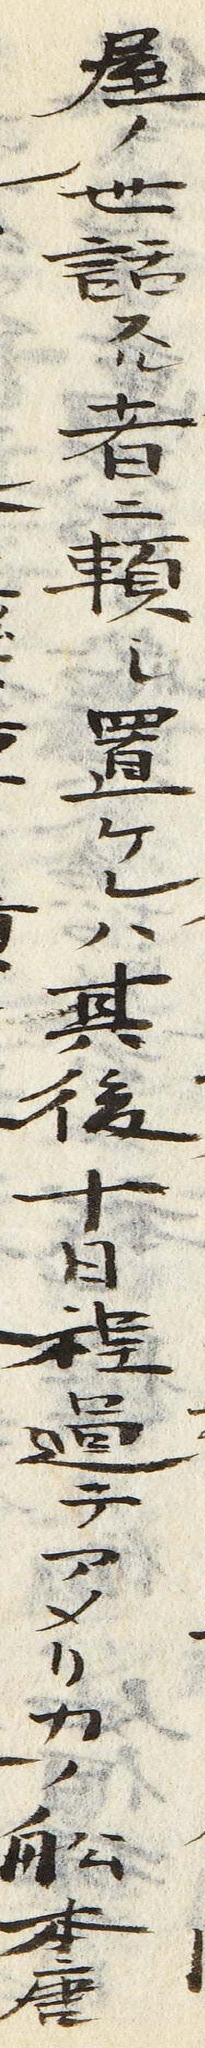屋ノ世話スル者ニ頼シ置ケレハ其後十日程過テアメリカノ船本唐
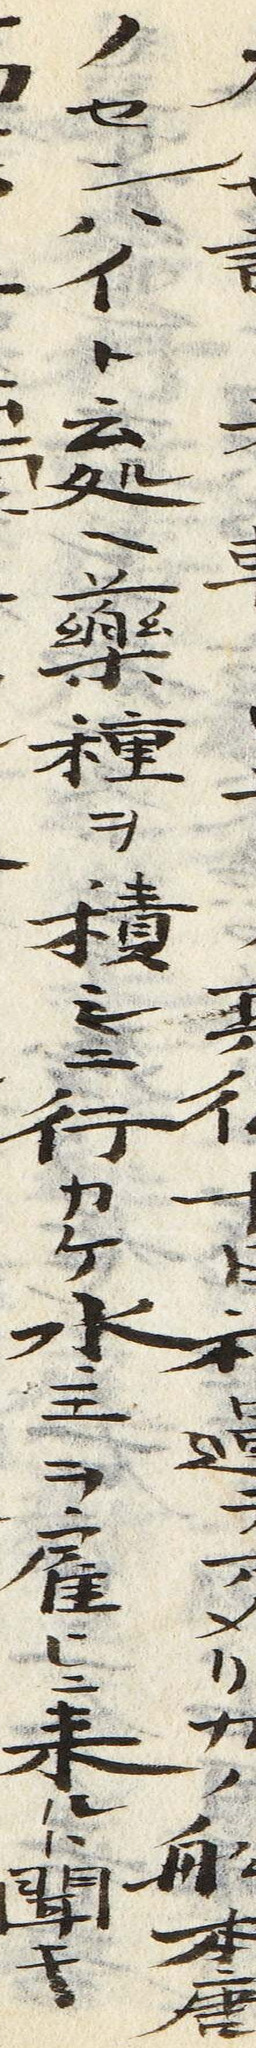ノセンハイト云処ヘ薬種ヲ積シニ行カケ水主ヲ雇ヒニ来ルト聞キ
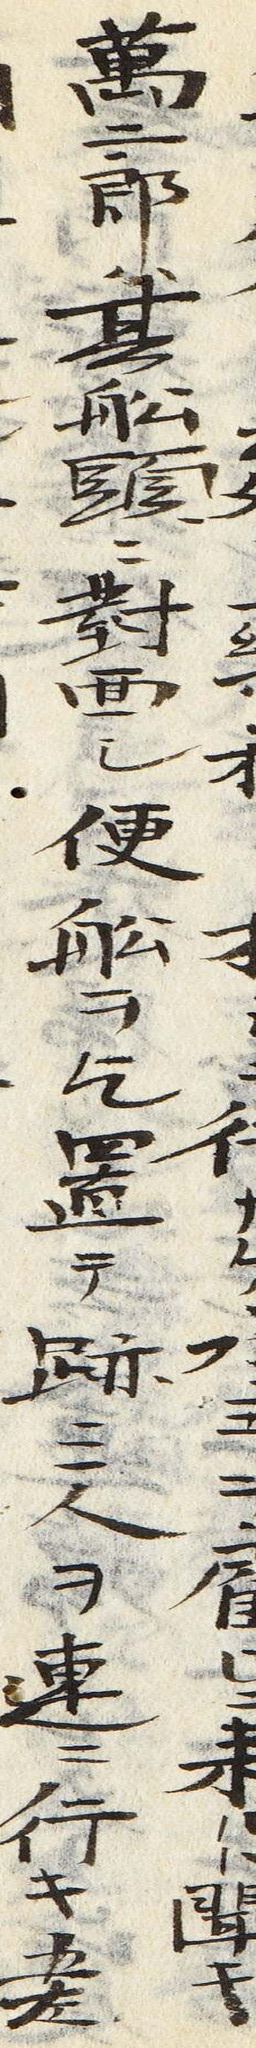萬二郎ハ其船頭ニ対面シ便船ヲ乞置テ跡三人ヲ連ニ行キ五左
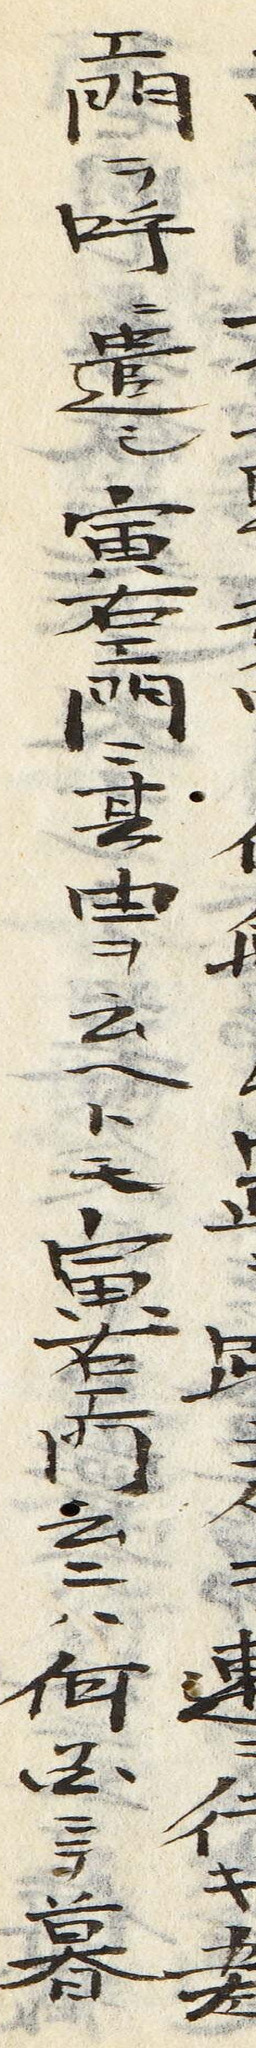衛門ヲ呼ニ遣シ寅右衛門ニ其由ヲ云ヘトモ寅右衛門云ニハ何国ニテ暮

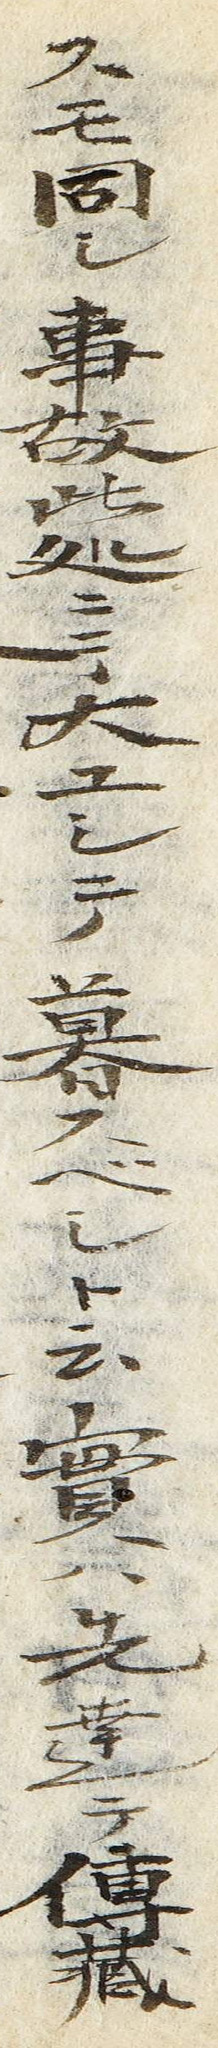スモ同シ事故此処ニテ大工シテ暮スベシト云実ハ先達テ傳蔵
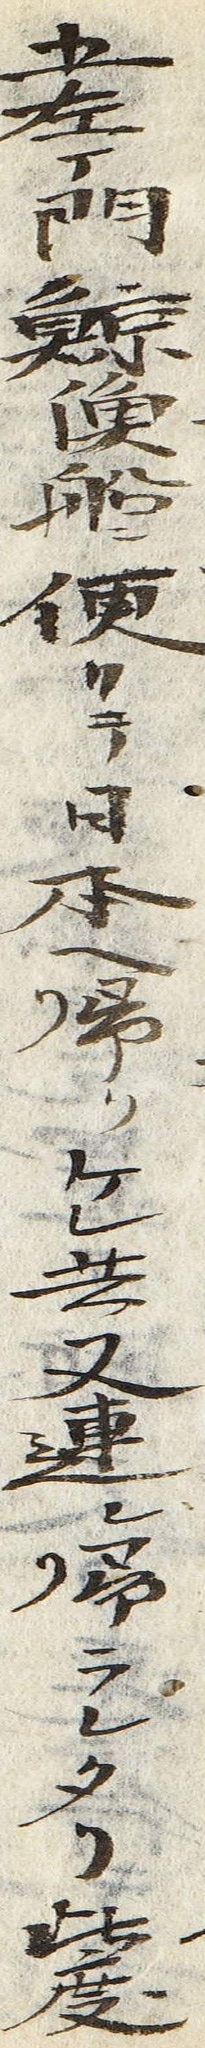五左衛門鯨漁船ニ便リテ日本ヘ帰リケレ共又連レ帰ラレタリ此度
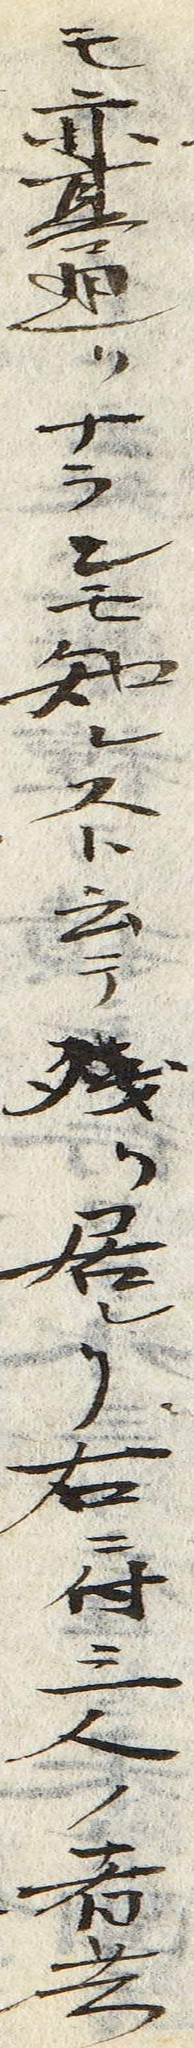モ亦其通リナラシモ知レスト云テ残リ居レリ右ニ付三人ノ者共
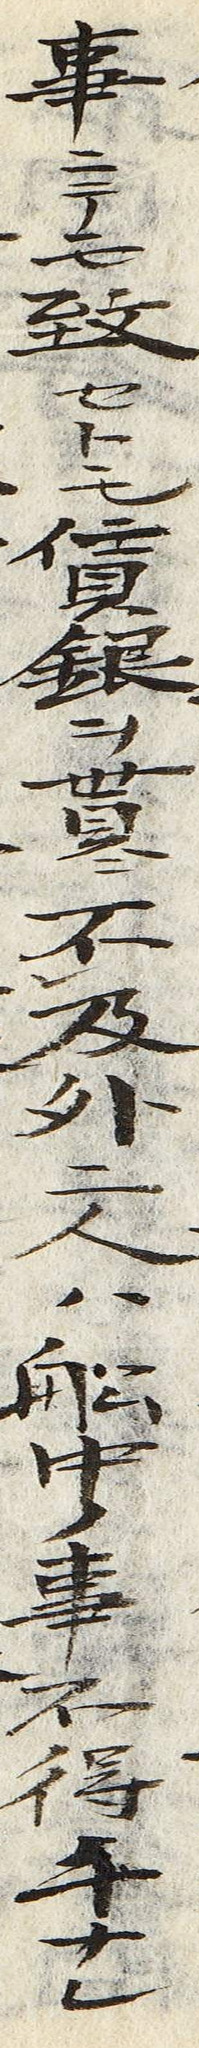事ニテモ致セシトモ賃銀ヲ貰ニ不及外二人ハ船中ノ事不得手ナレ
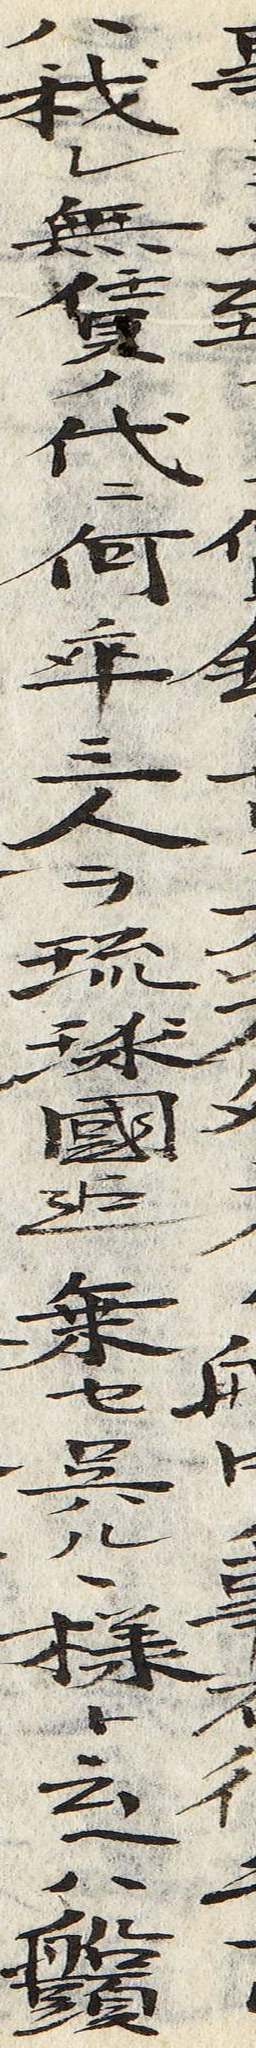ハ我レ無賃ノ代ニ何卒三ヲ琉球国迄乗セ呉ルヽ様ト云ヘハ船頭
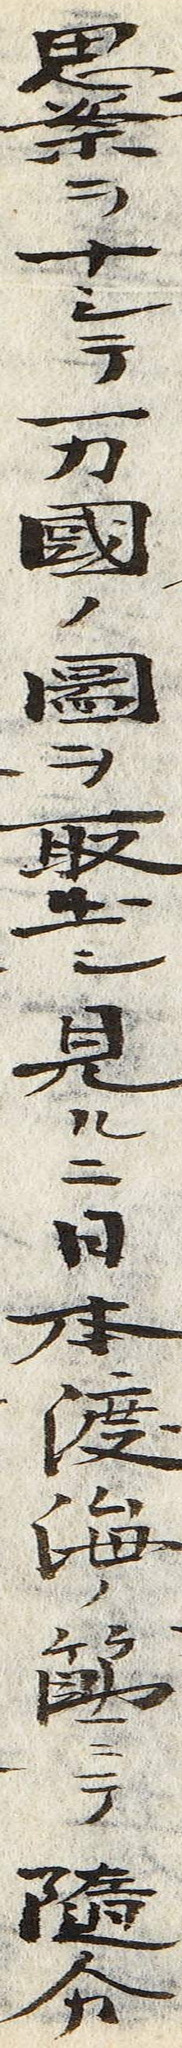思案ヲナシテ万国ノ図ヲ取出シ見ルニ日本渡海ノ節ニテ随分
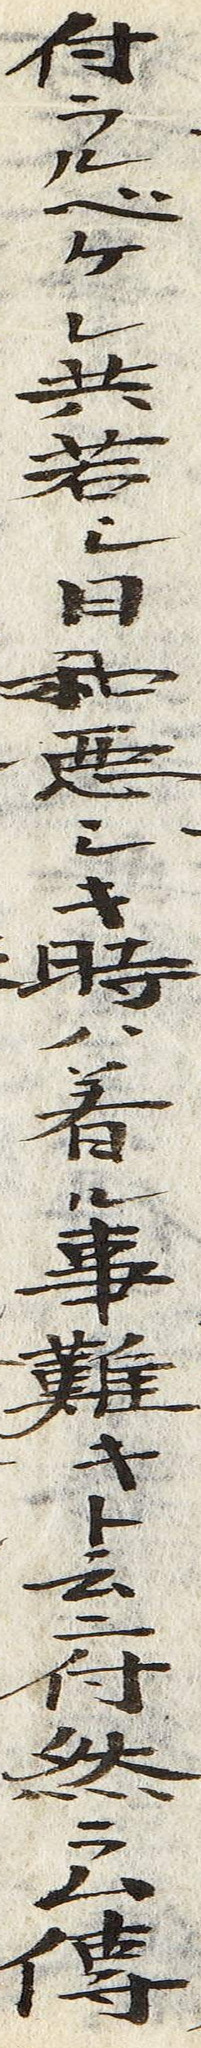付ラルベケレ共若シ日和悪シキ時ハ着ル事難キト云ニ付然ラム傳
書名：漂流記聞
